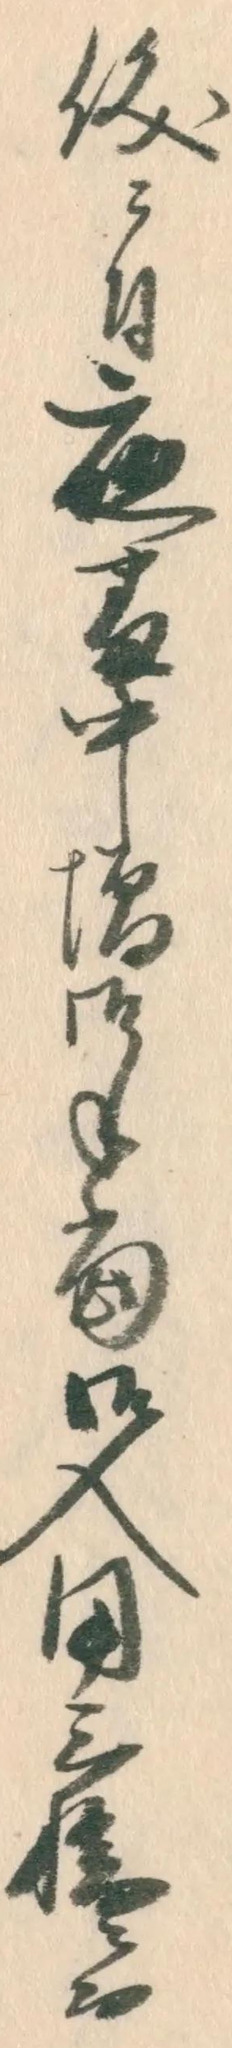儀ニ付夜番中増御手当御入用三橋ニ而
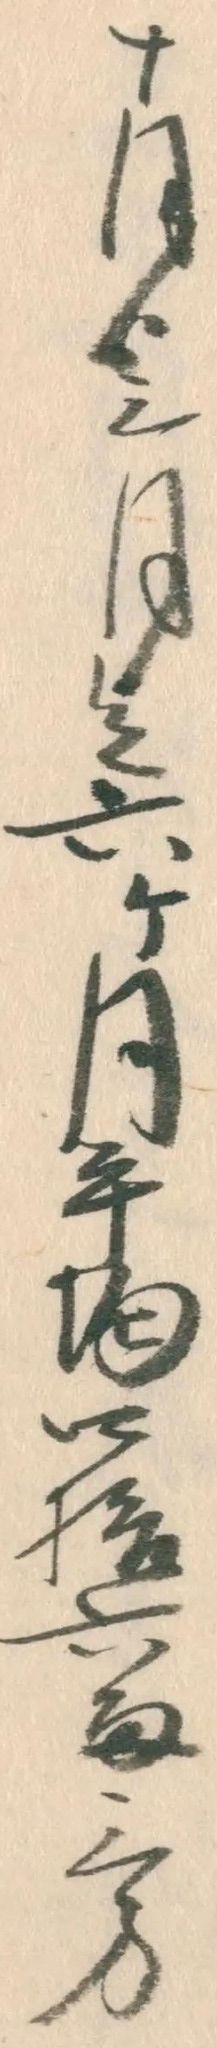十月ゟ三月迄六ケ月平均四拾六両三分
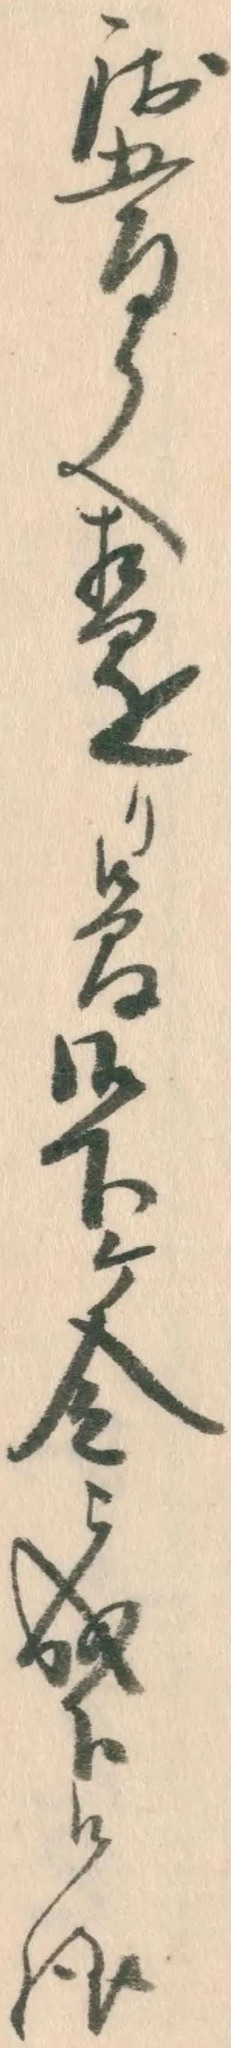銭五百文相懸り候間御下ケ金被成下候様
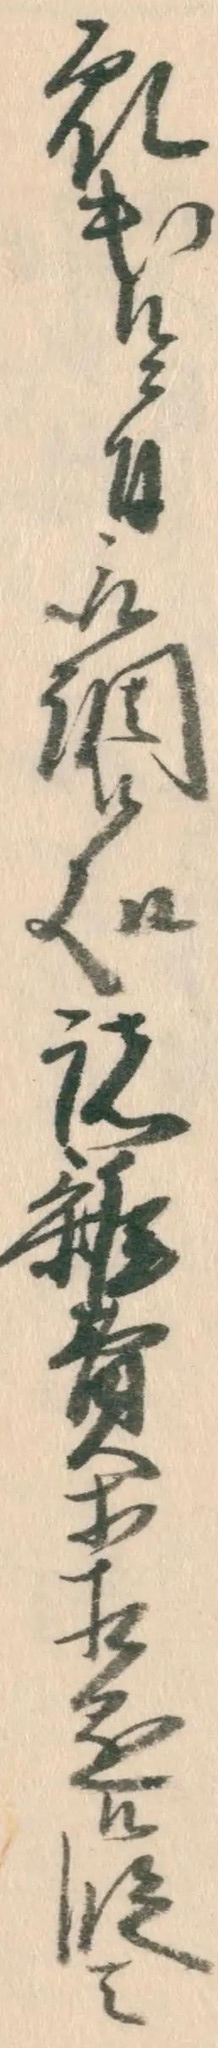願出候ニ付取調候処諸雑費等相懸り候段は
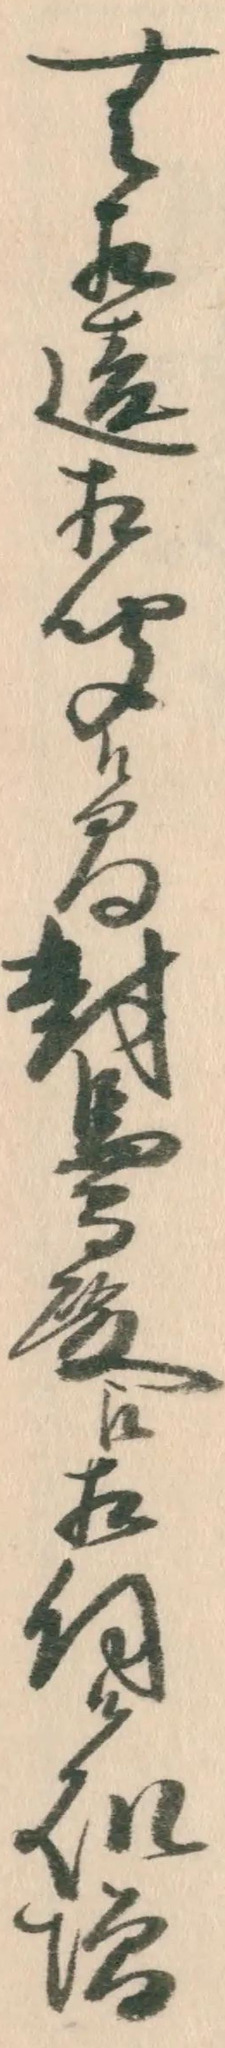無相違相聞候間対馬守殿え相伺候処増
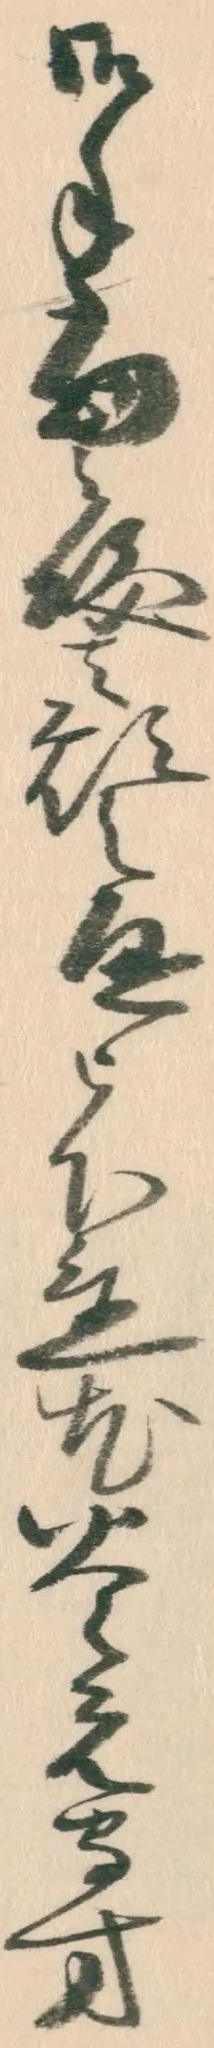御手当之儀は願之通被下置尤火之元守方
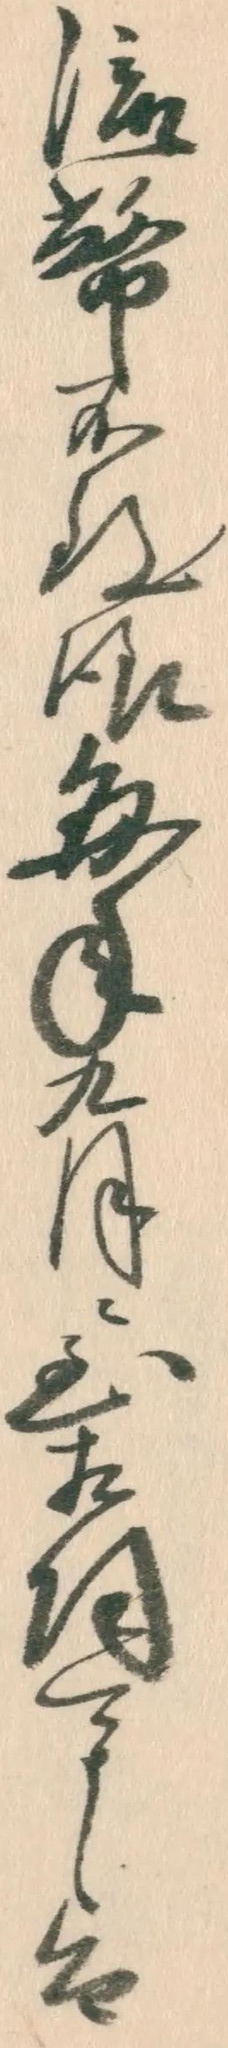流弊不致様毎年九月ニ至相伺可申旨
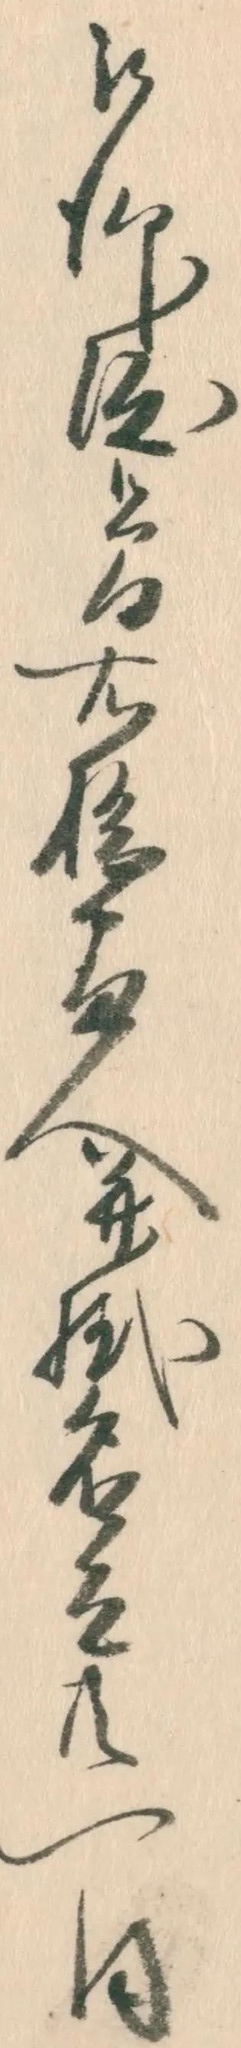被仰渡候間右橋番人并掛名主共一同
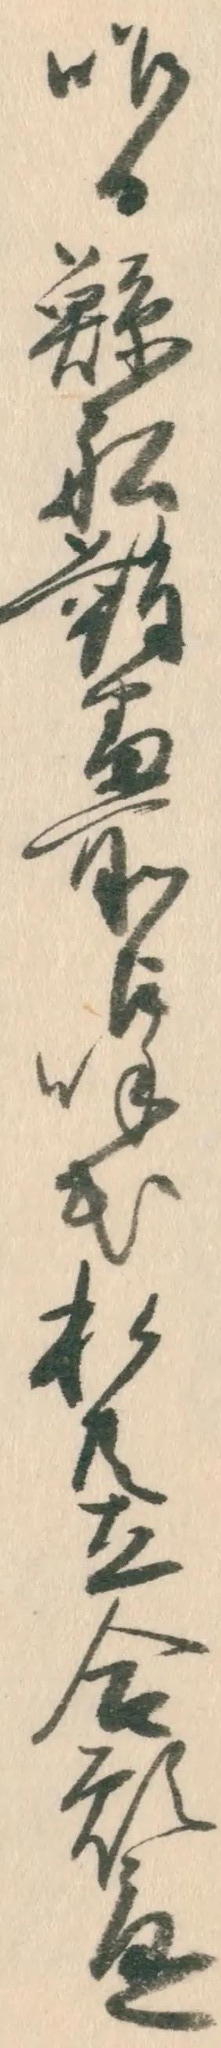昨日鯨船鞘番所え呼出私共立合願通
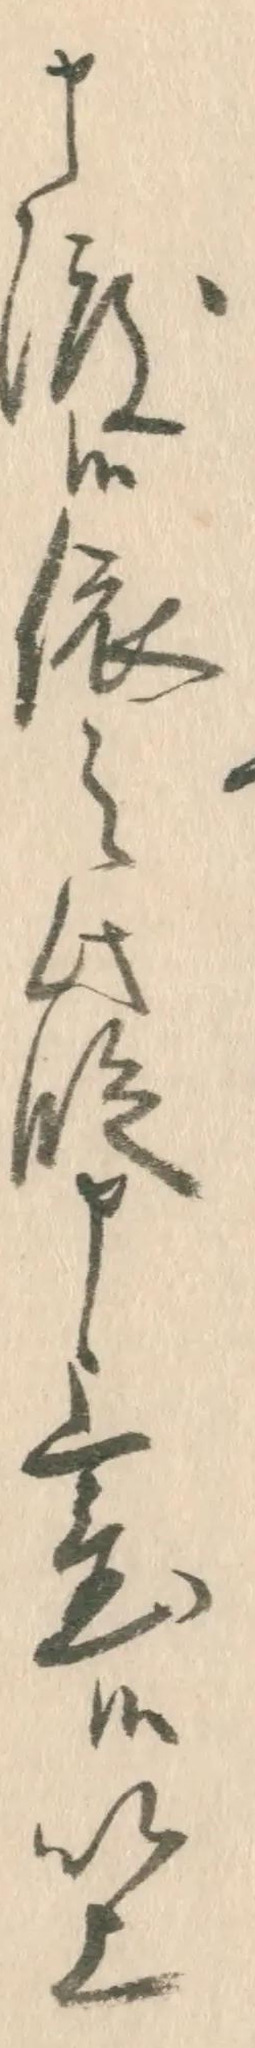申渡候依之此段申上置候以上
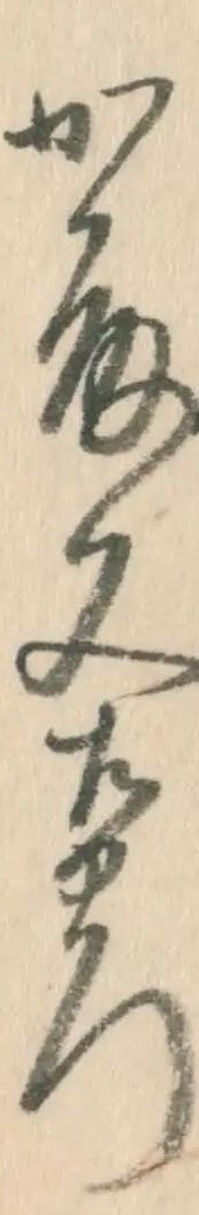加藤又左衛門

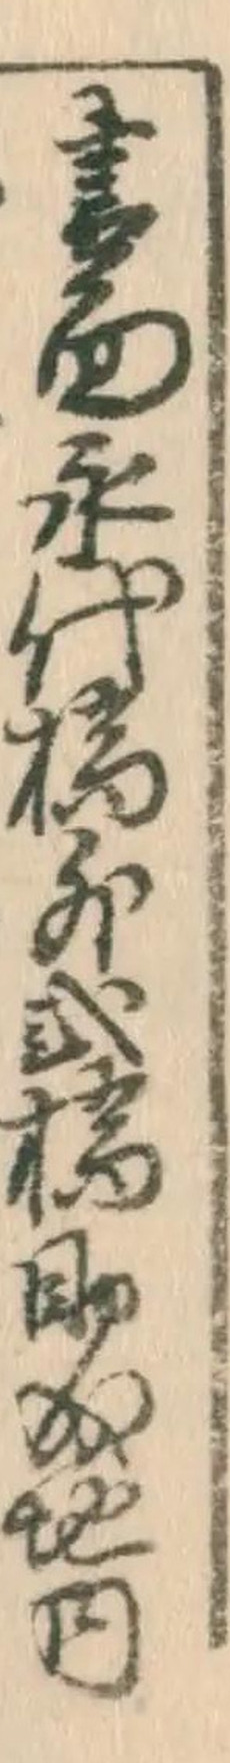書面永代橋外弐橋助成地内
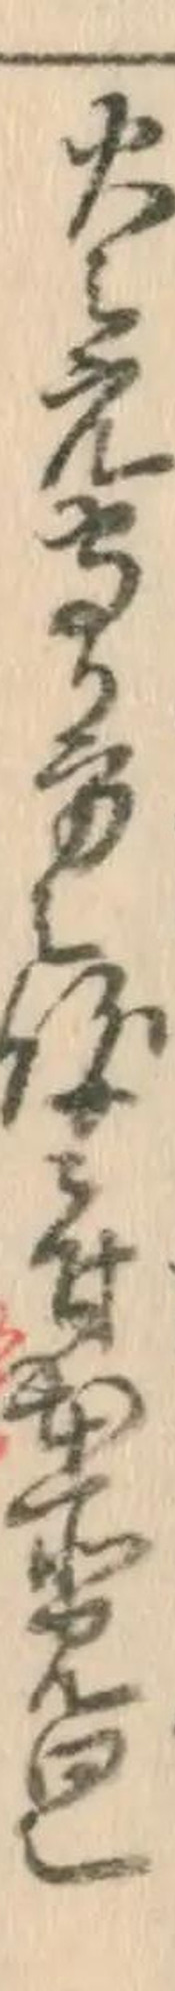火之元守り方之儀ニ付本所見廻
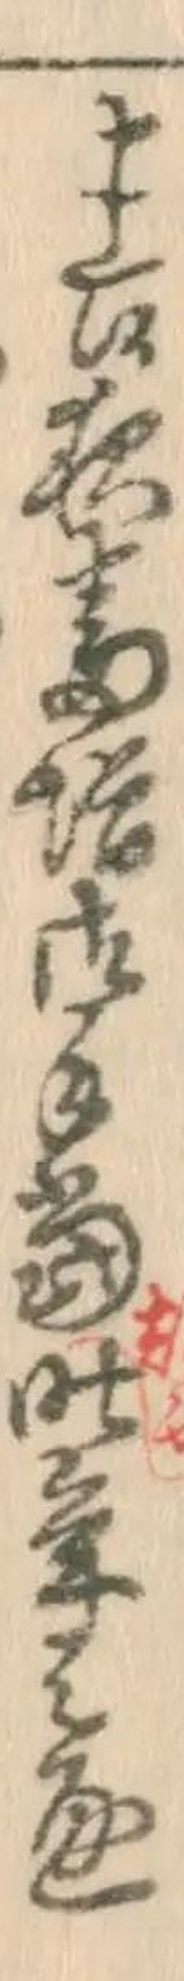申上候夜番増御手当都而昨年之通
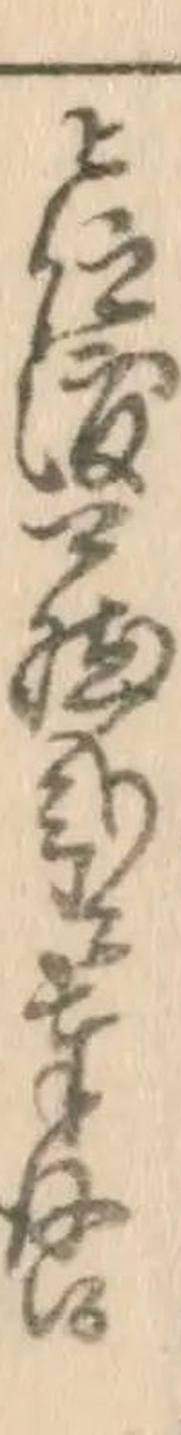被仰渡可然と奉存候
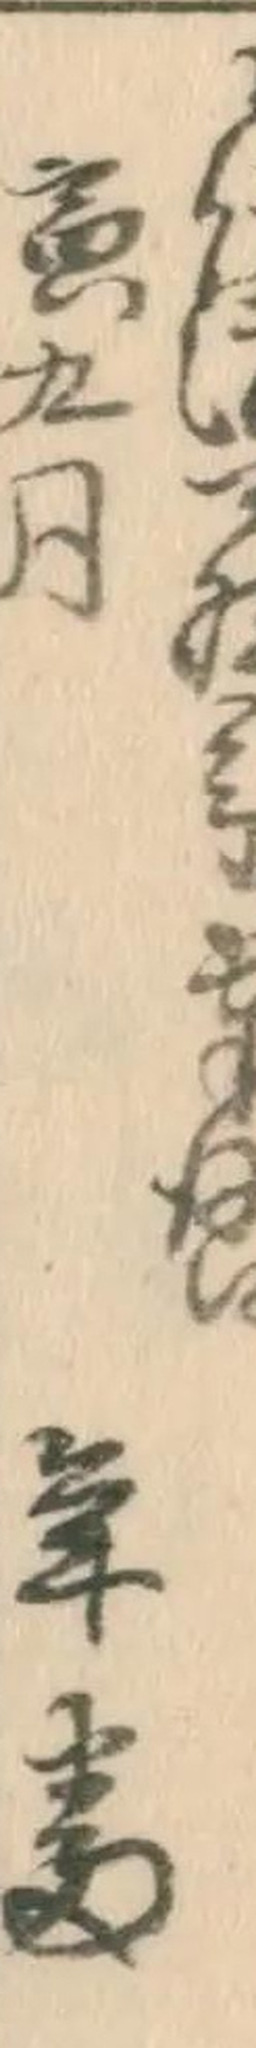寅九月年番
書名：三橋 17巻. [7] 三橋小破御修復書留　但御奉行御掛リ替地震潰橋番屋　嘉永四亥年より安政二卯年迄　上
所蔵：国立国会図書館 National Diet Library, JAPAN
